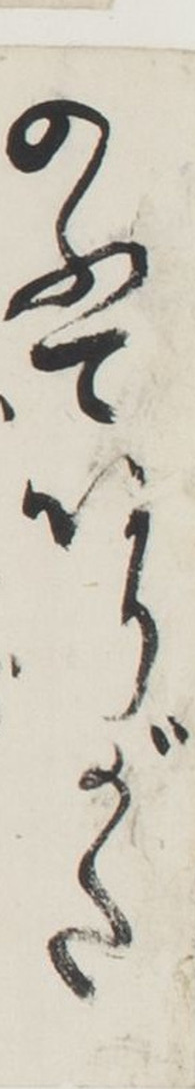のふてありがた
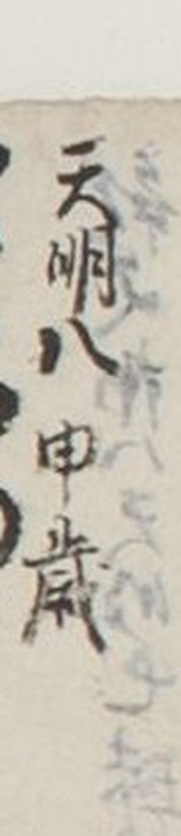天明八申歳
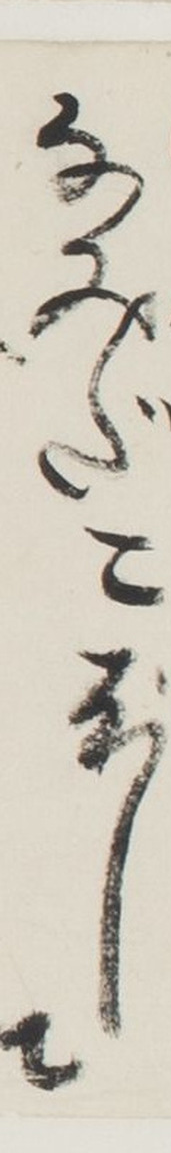なみだこぼして
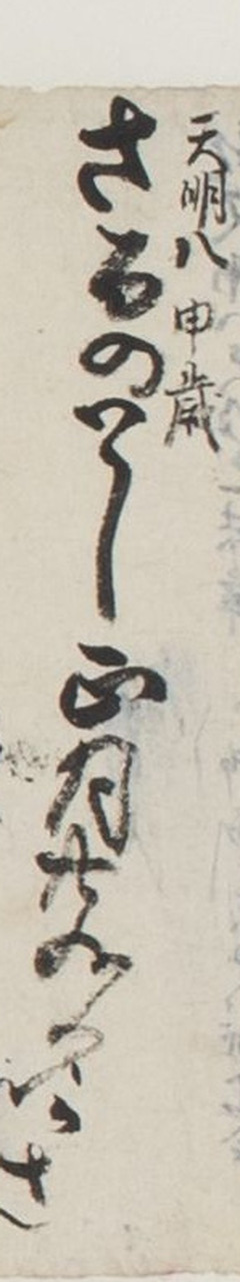さるのとし正月廿九日あさ
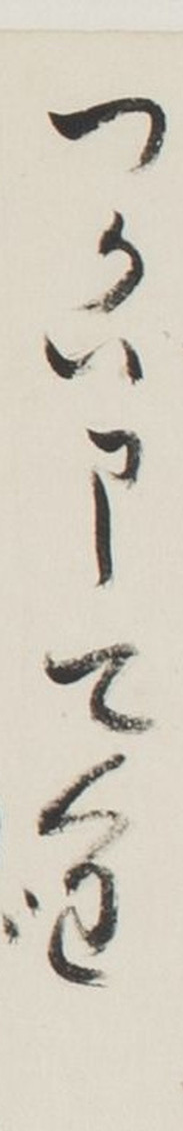つかい申てくわじ
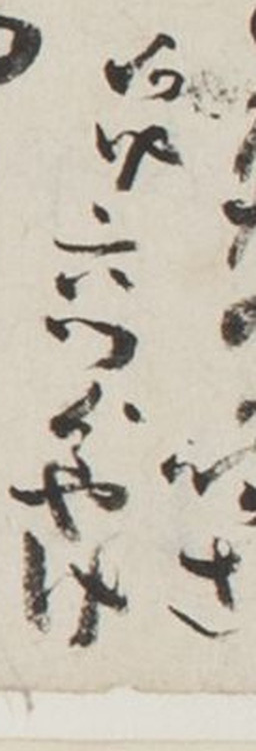あけ六ツゟやけ
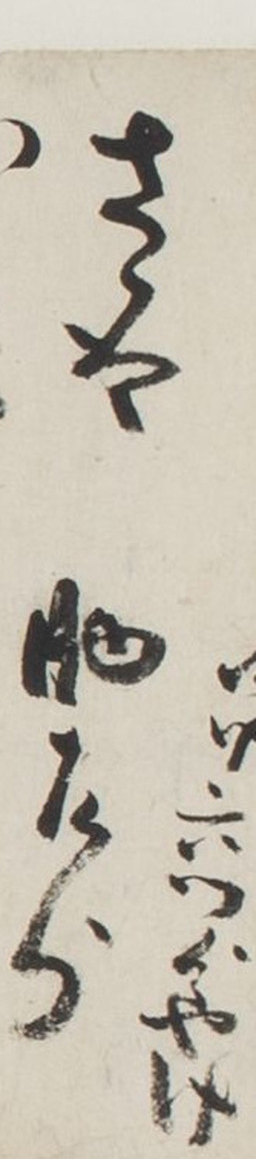さゝや助左衛門
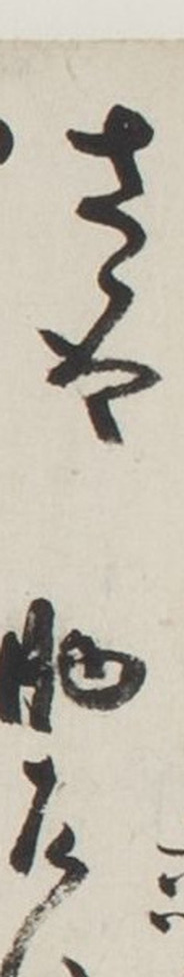さゝや助左衛門
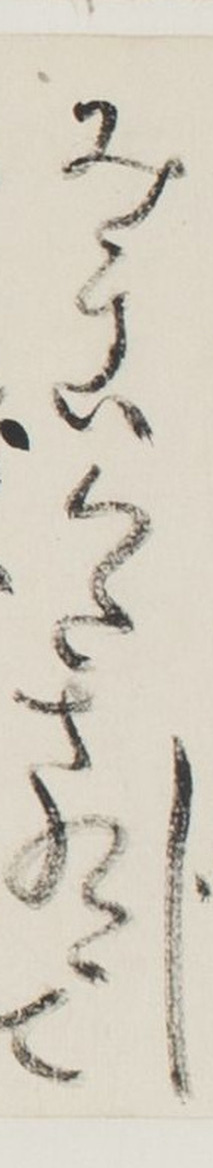みまいくたされ候て
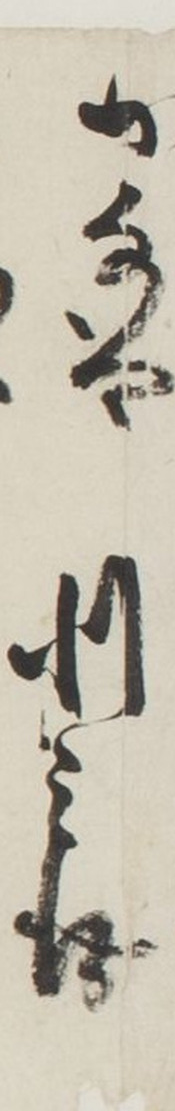かなや利兵衛
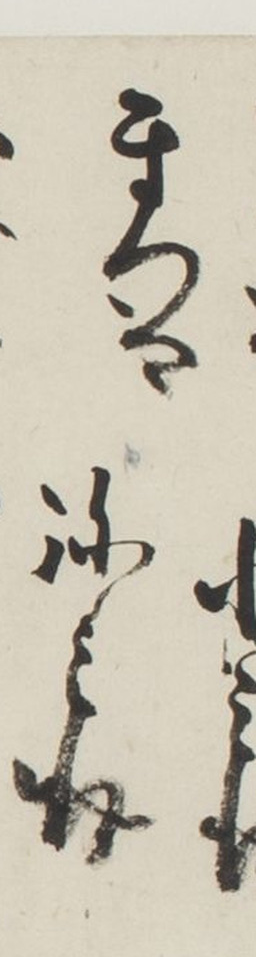まつや弥兵衛
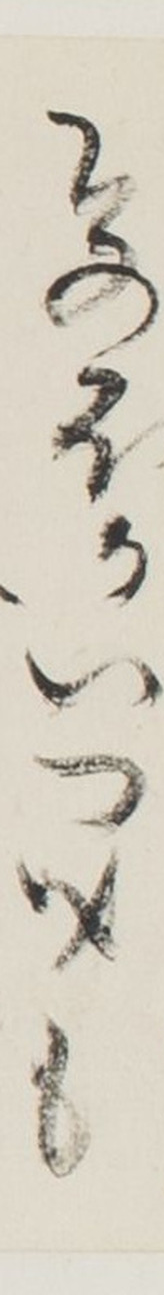そのほかいつけも
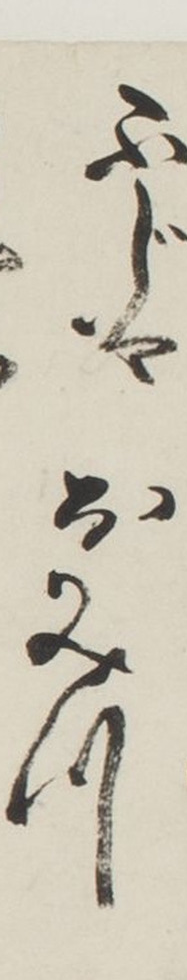ふじやおみつ
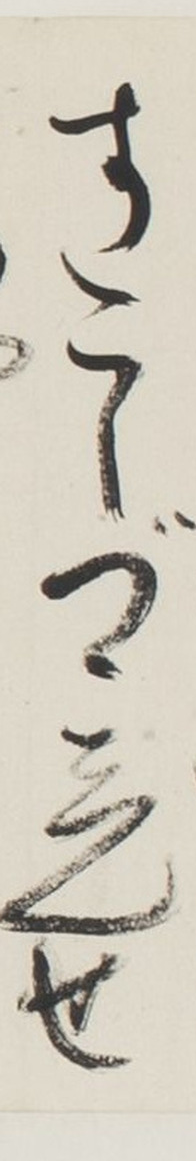すこしづゝしんせ
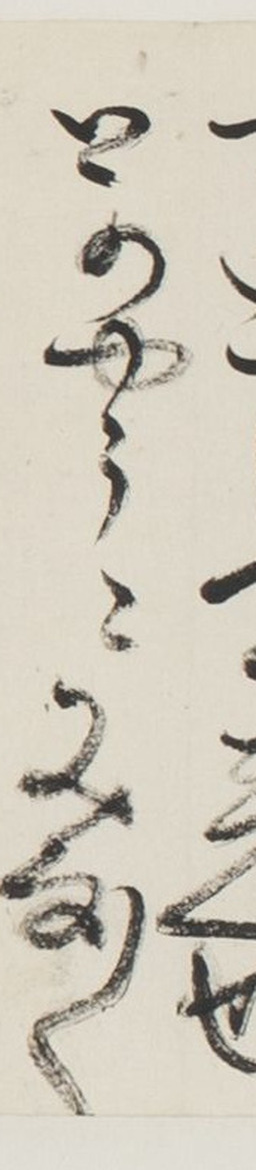とのやうにみな〳〵
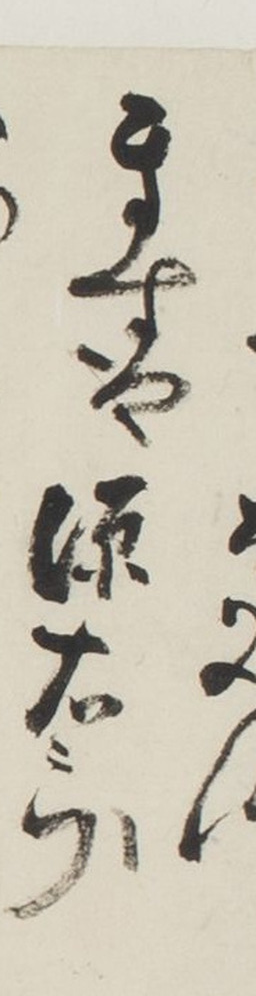ますや源右衛門
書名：京洛中大焼節届の次第
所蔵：あいおいニッセイ同和損保株式会社
